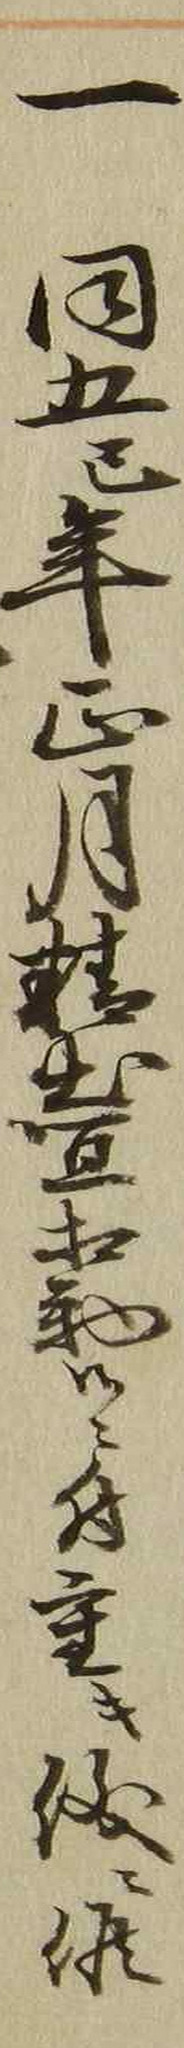一同五巳年正月精出宣相勤候ニ付重キ儀ニ候
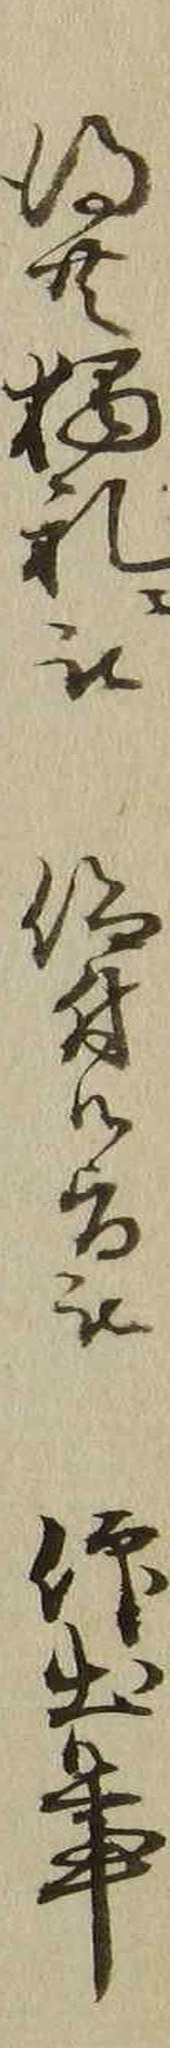得共独礼ニ被仰付候旨被仰出候事
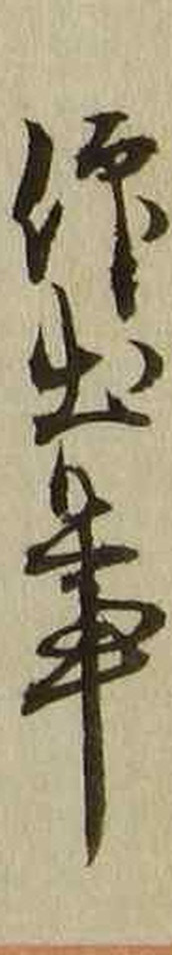仰付候事
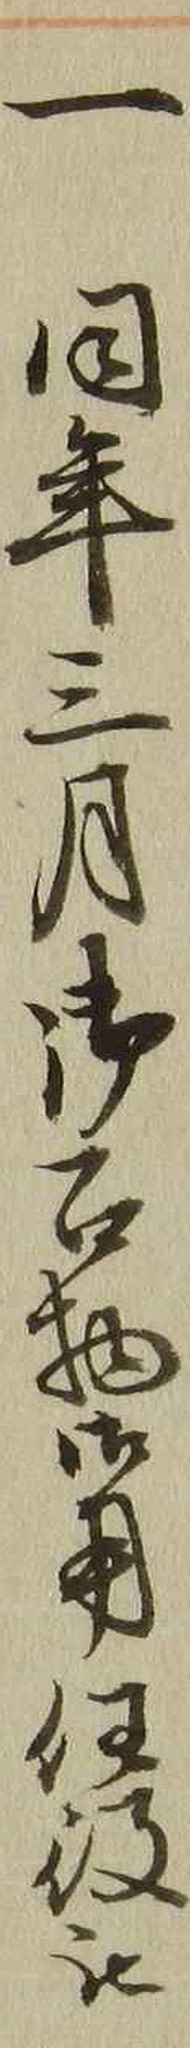一同年三月御召物御用任役被
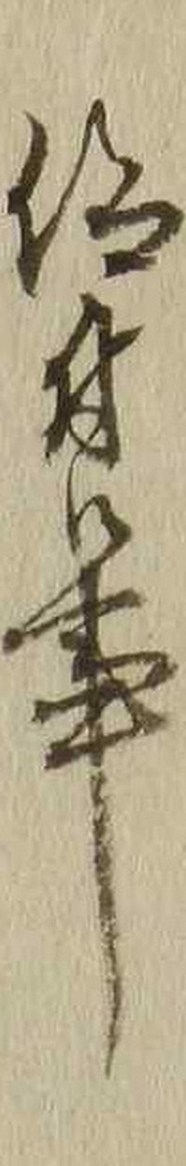仰付候事
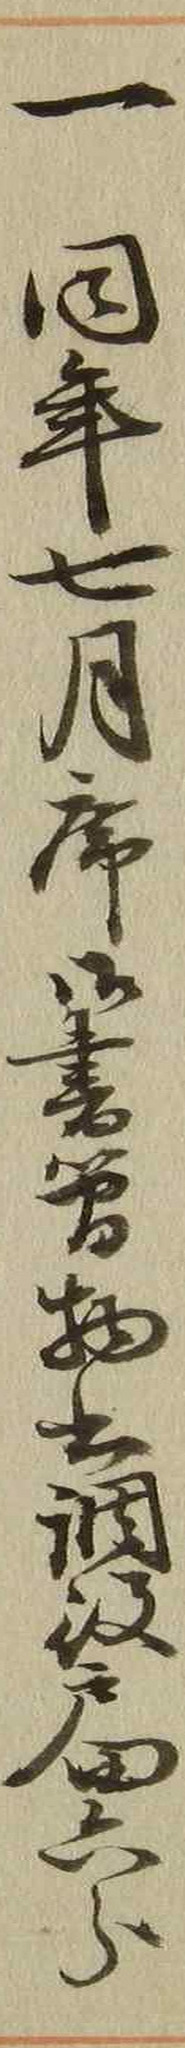一同年七月席御書簡物書調役戸田六郎
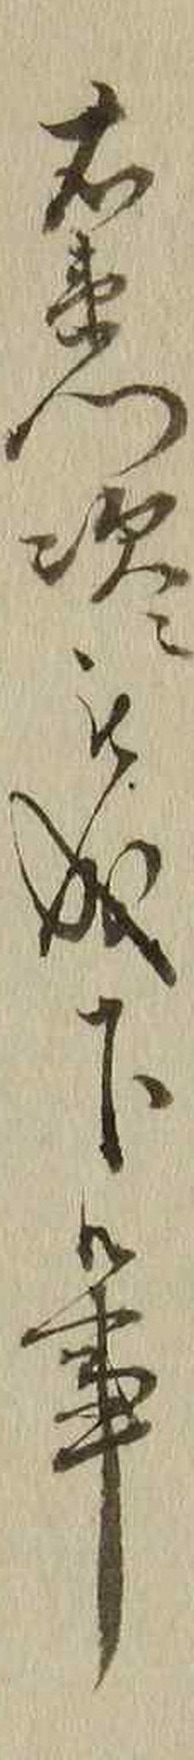右衛門次ニ被成下候事
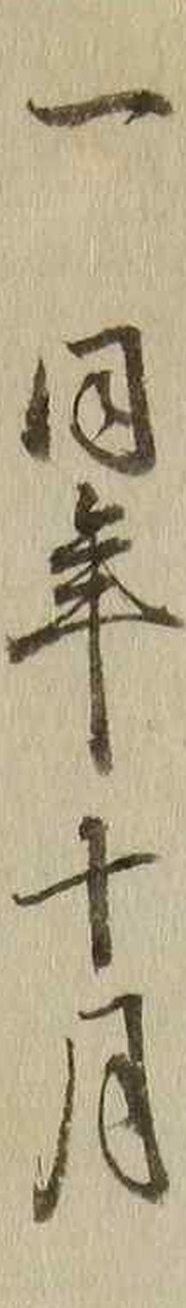一同年十月
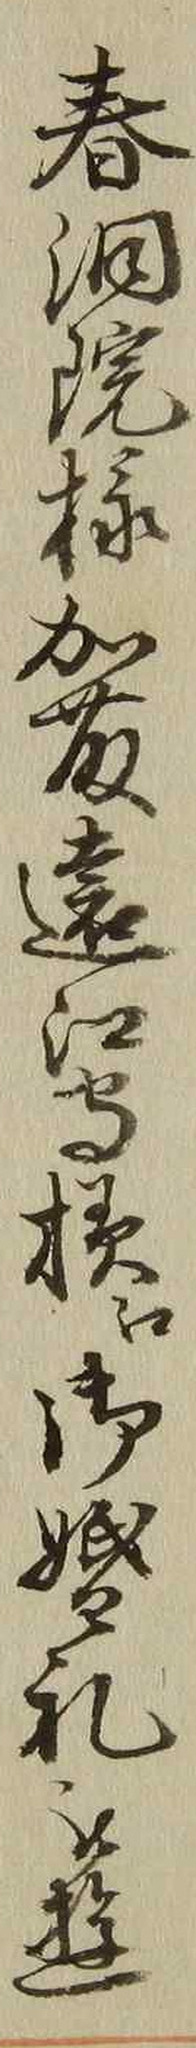春洞院様加藤遠江守様江御婚礼被遊
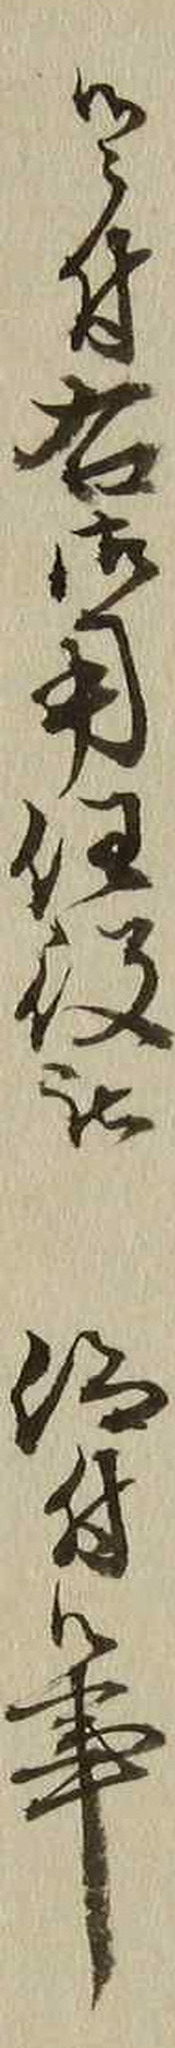候ニ付右御用任役被仰付候事
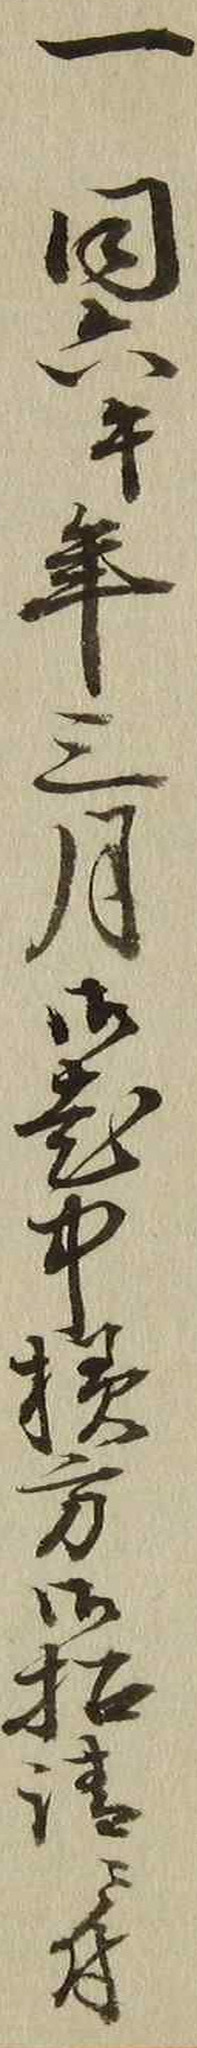一同六午年三月御老中方御招請ニ付
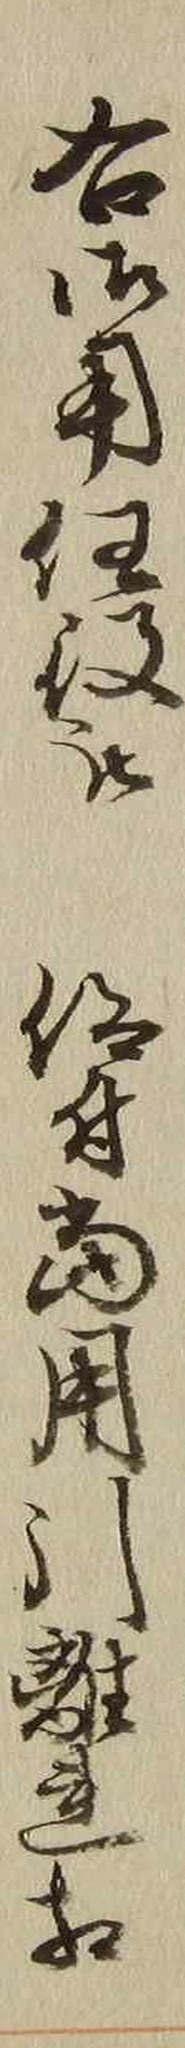右御用任役被仰付当用引離連相
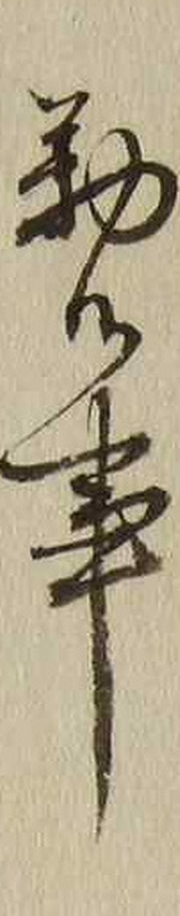勤候事
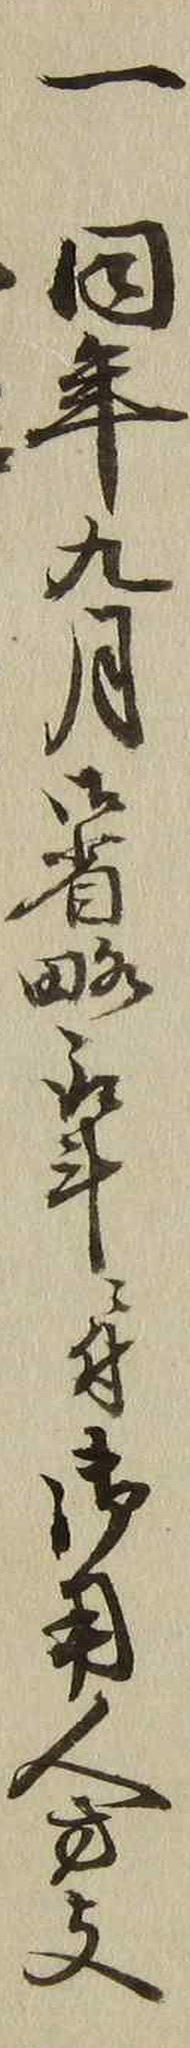一同年九月御省略取斗ニ付御用人方支
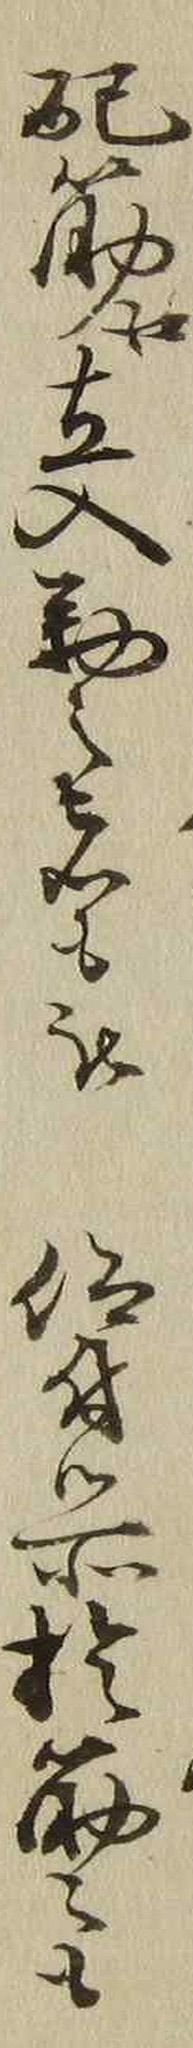配筋江立入勤之者も被仰付候所於筋々も
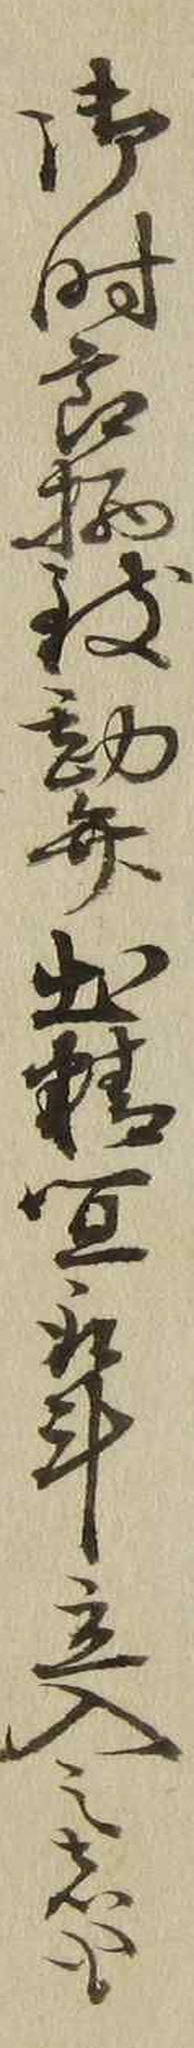御時節柄致勘弁出精宣取斗立入之者へも
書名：諸士系譜　巻之64　と之部7
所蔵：会津若松市立会津図書館
